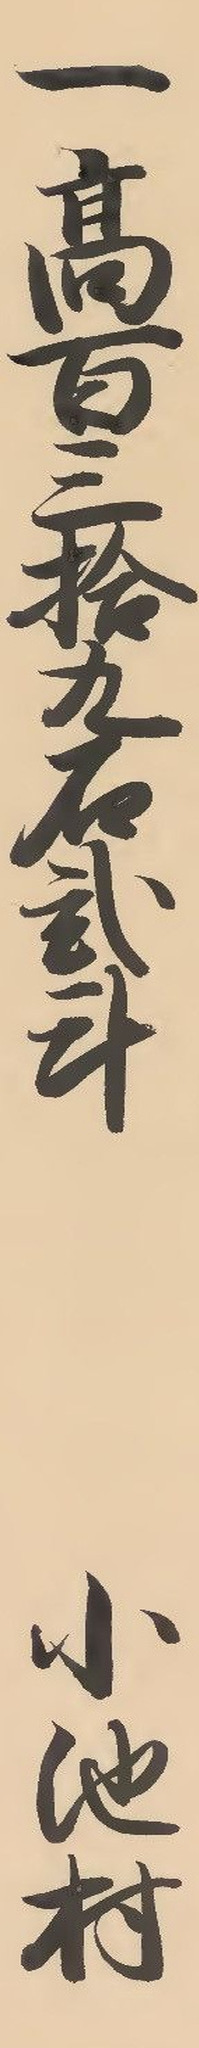一高百三拾九石弐斗小池村
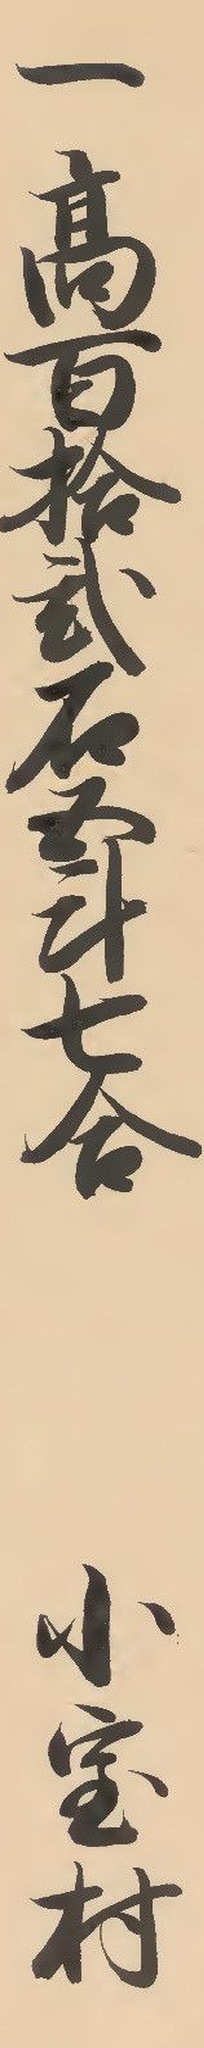一高百拾弐石五斗七合小室村
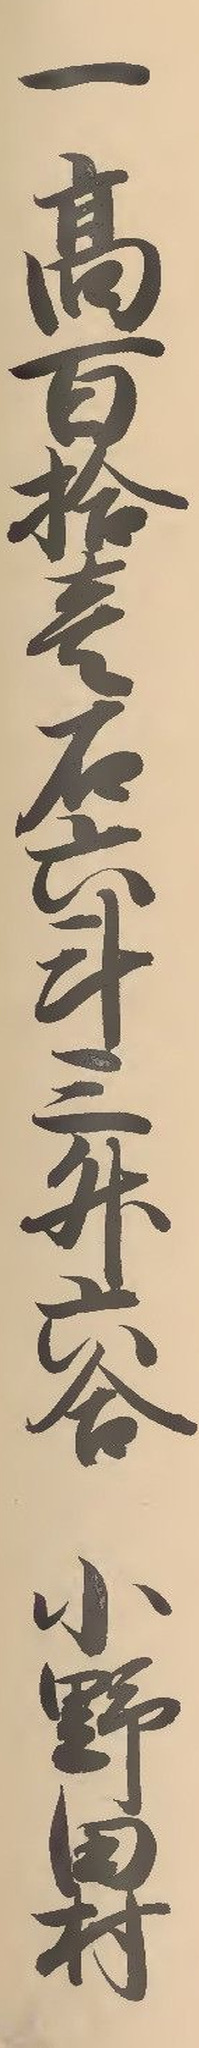一高百拾壱石六斗三升六合小野田村
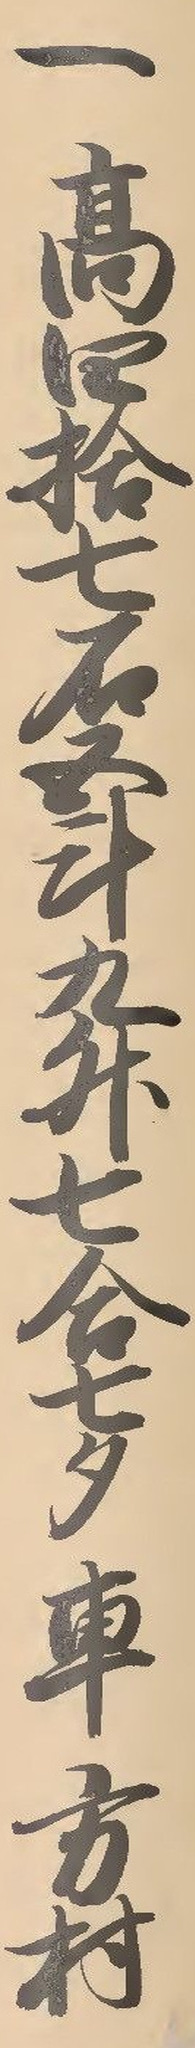一高四拾七石五斗九升七合七勺車方村
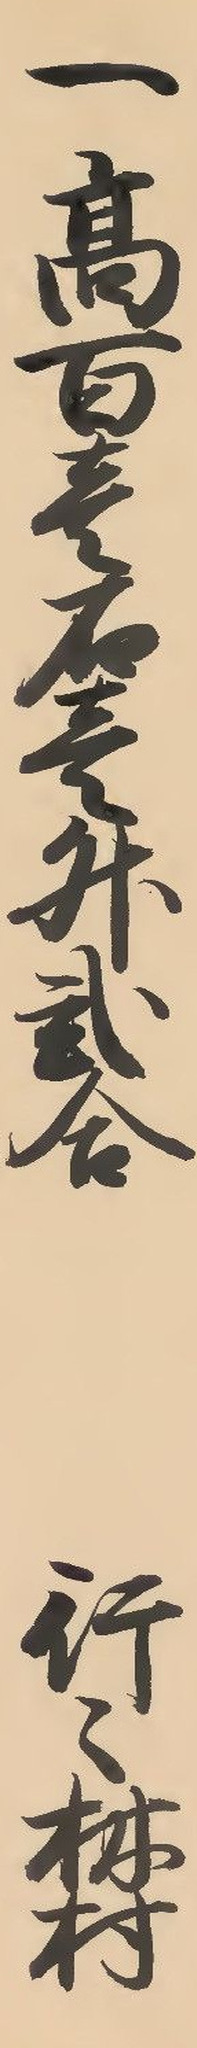一高百壱石壱升弐合行々林村
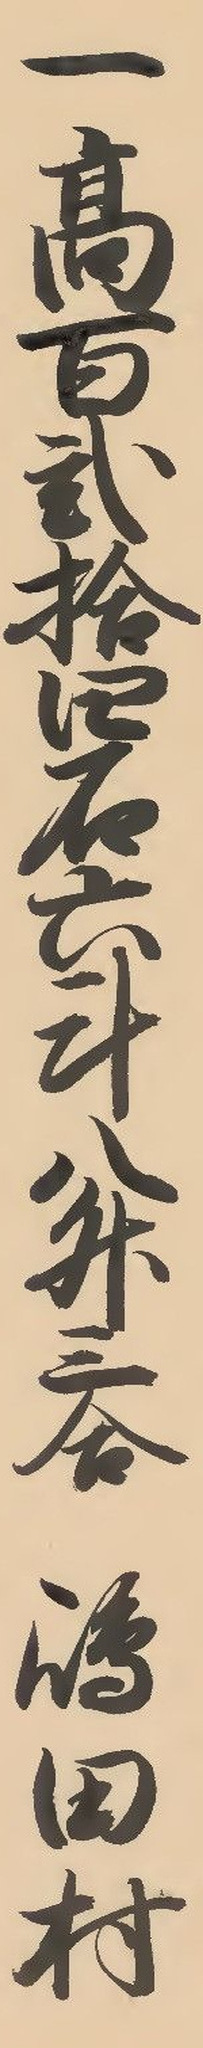一高百弐拾四石六斗八升三合島田村
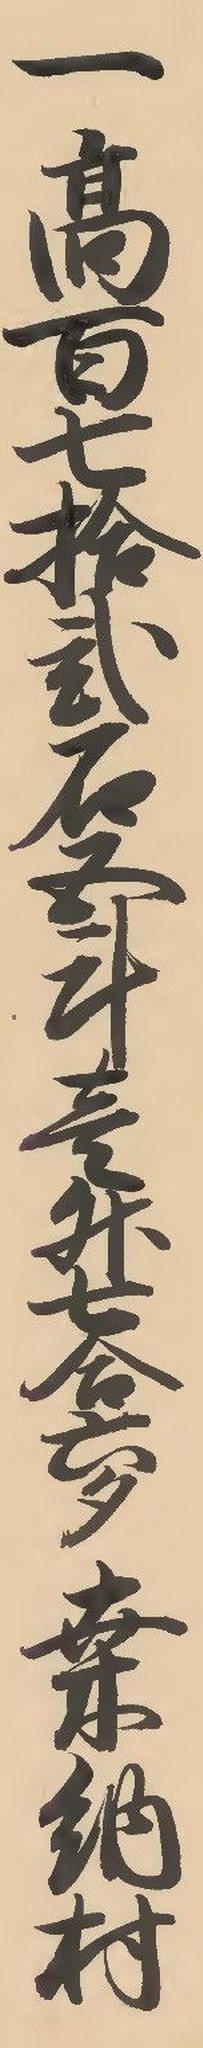一高百七拾弐石五斗壱升七合六勺桑納村

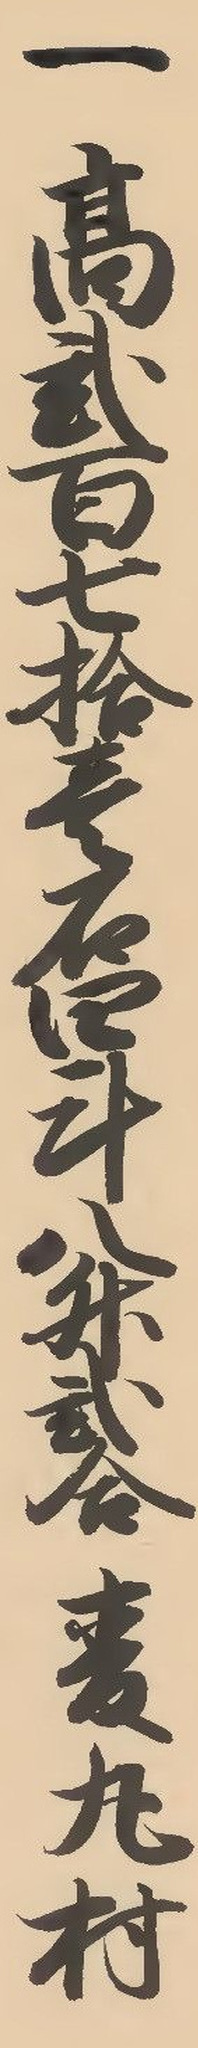一高弐百七拾壱石四斗八升弐合麦丸村
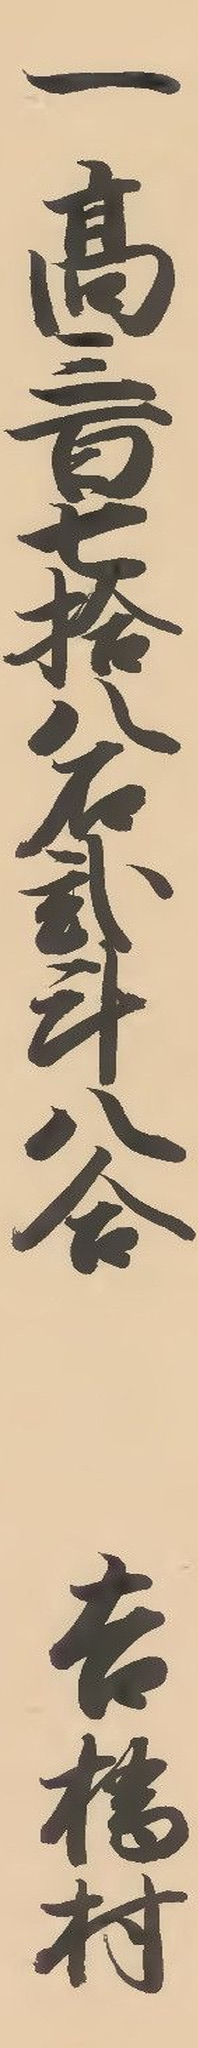一高三百七拾八石弐斗八合吉橋村
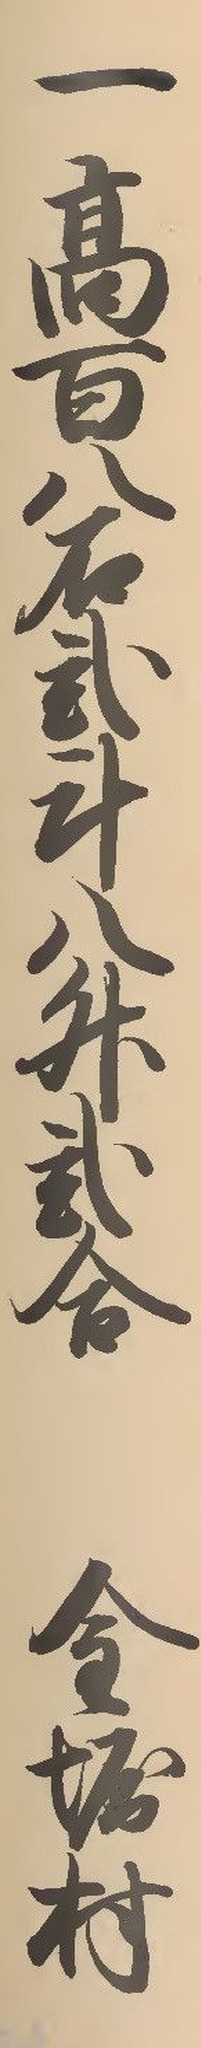一高百八石弐斗八升弐合金堀村
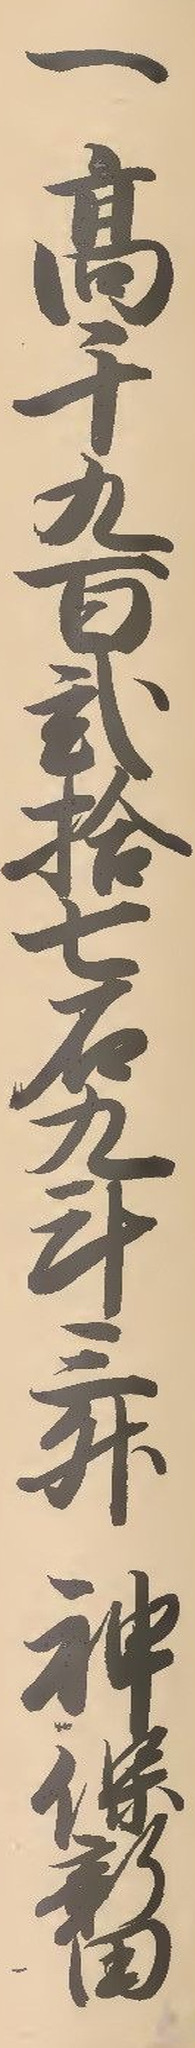一高千九百弐拾七石九斗三升神保新田
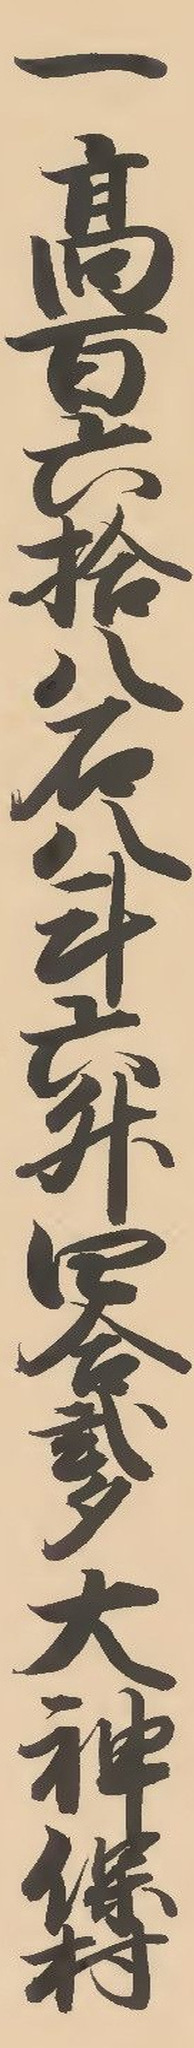一高百六拾八石八斗六升四合弐勺大神保村
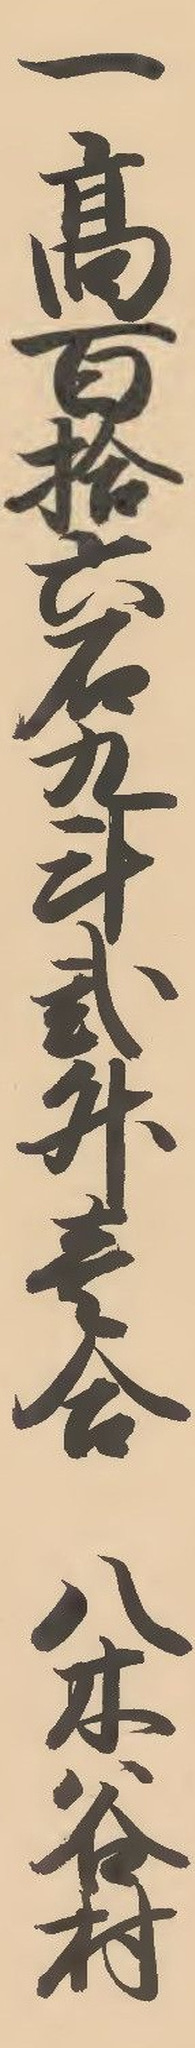一高百拾六石九斗弐升壱合八木谷村
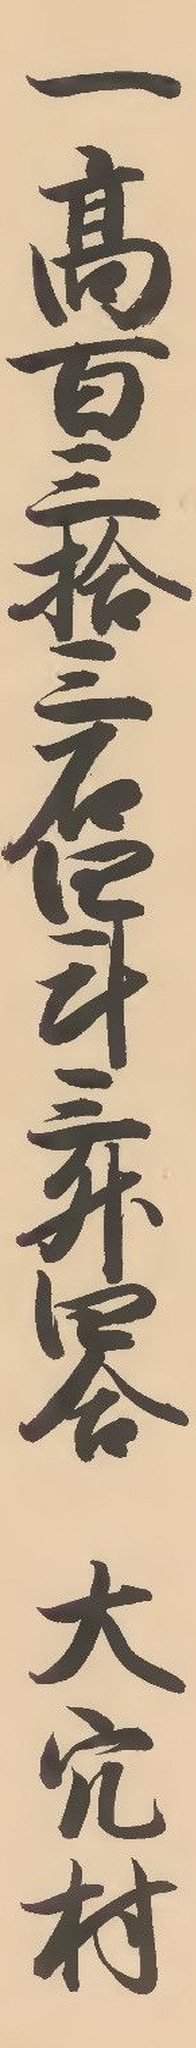一高百三拾三石四斗三升四合大穴村

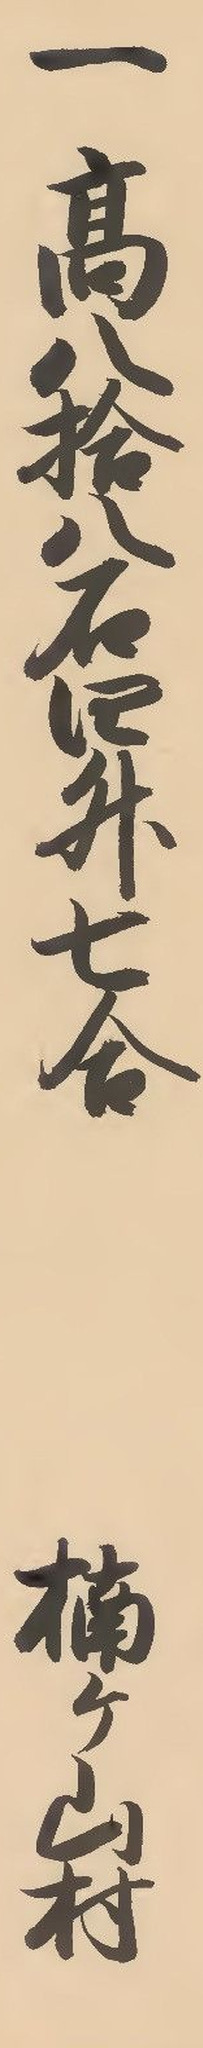一高八拾八石四升七合楠ヶ山村
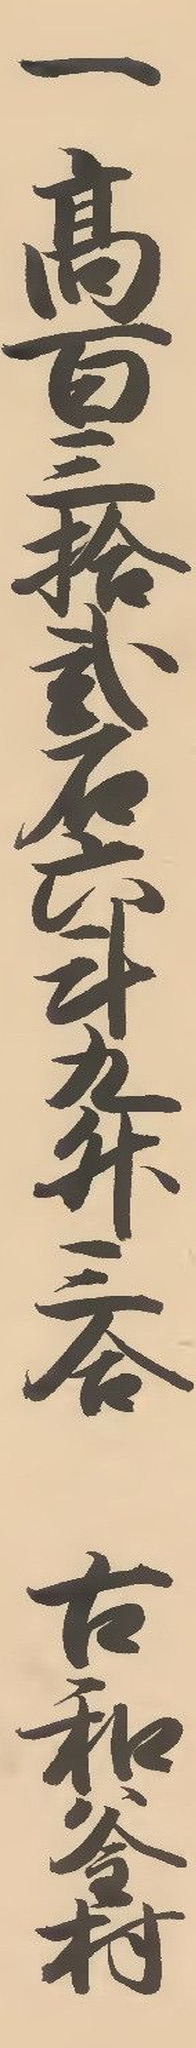一高百三拾弐石六斗九升三合古和釜村
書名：下総国郷帳
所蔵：国立公文書館 National Archives of Japan
